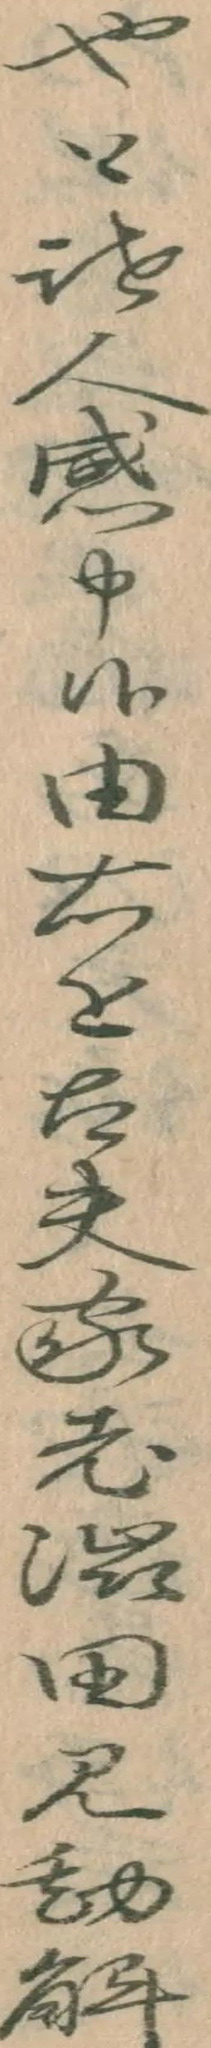也と諸人感申候由右近太夫家老渋田見勘解
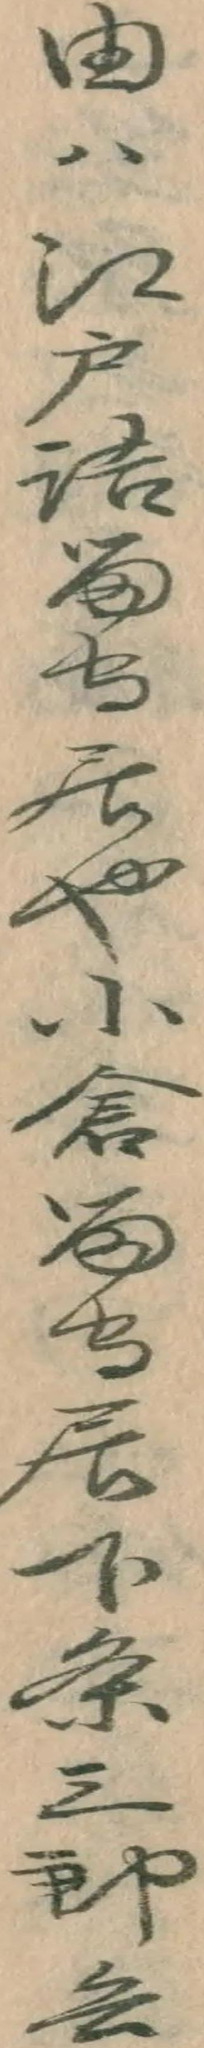由は江戸詰留守居也小倉留守居下条三郎兵
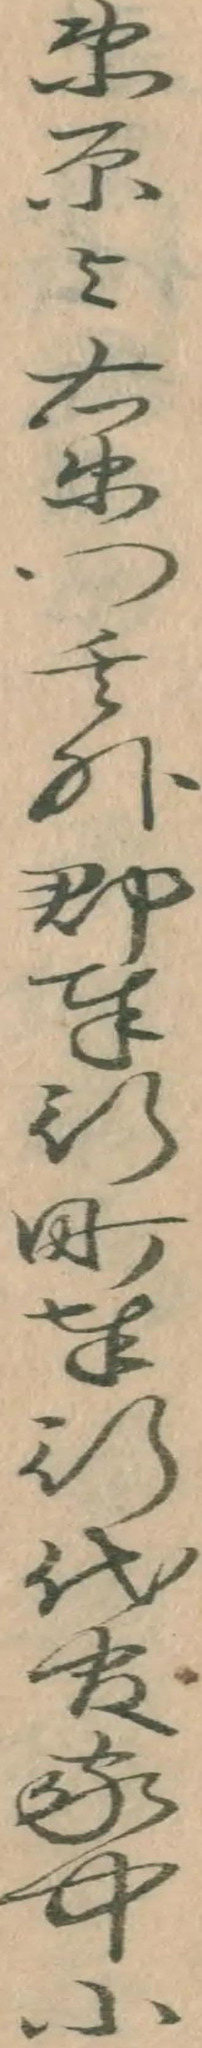衛門与右衛門其外郡奉行町奉行代官家中小

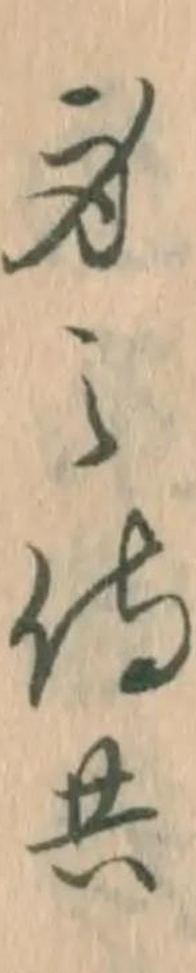身之侍共
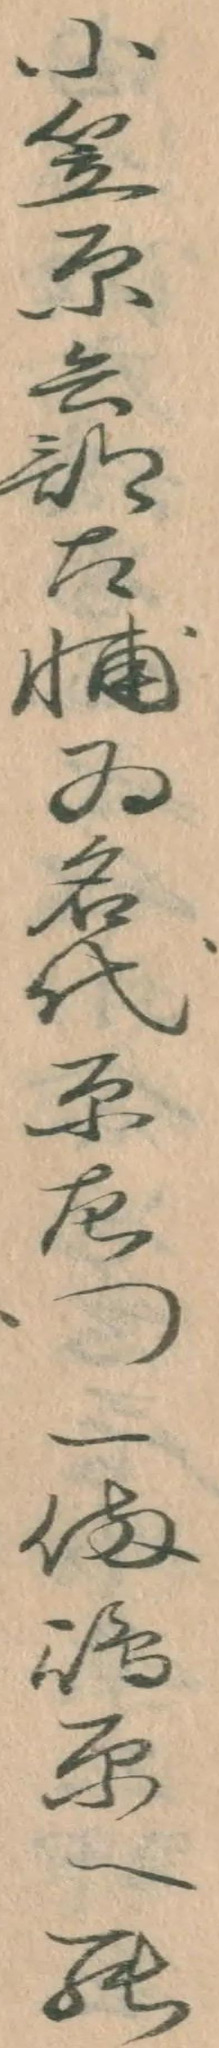小笠原兵部太輔ゐ名代原左門一備島原へ罷
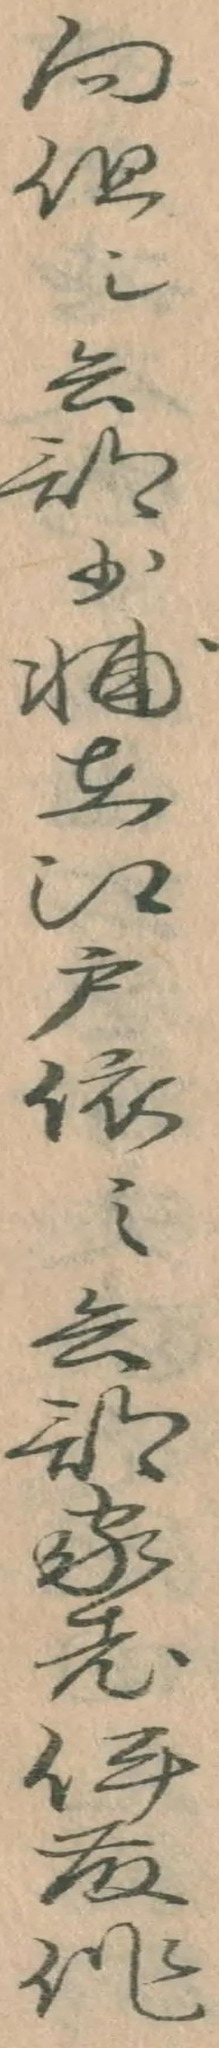向但し兵部少輔在江戸依之兵部家老伊藤作
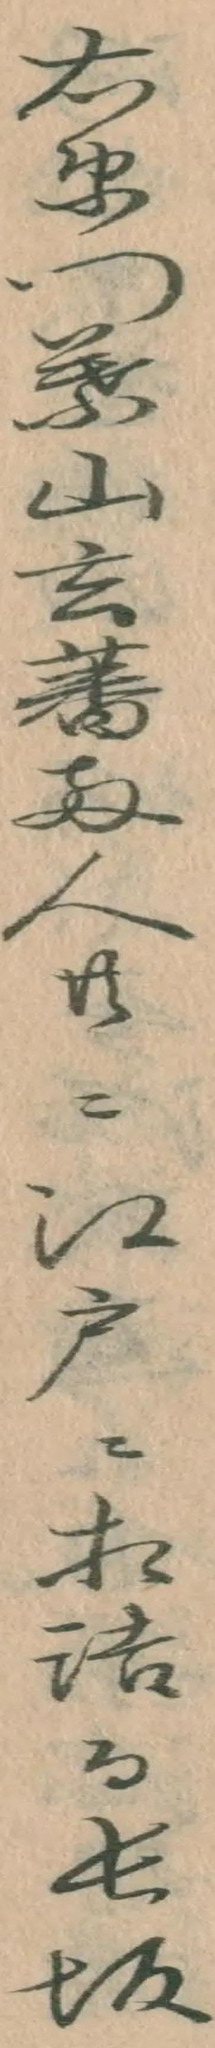右衛門葉山玄蕃両人共に江戸に相詰る長坂
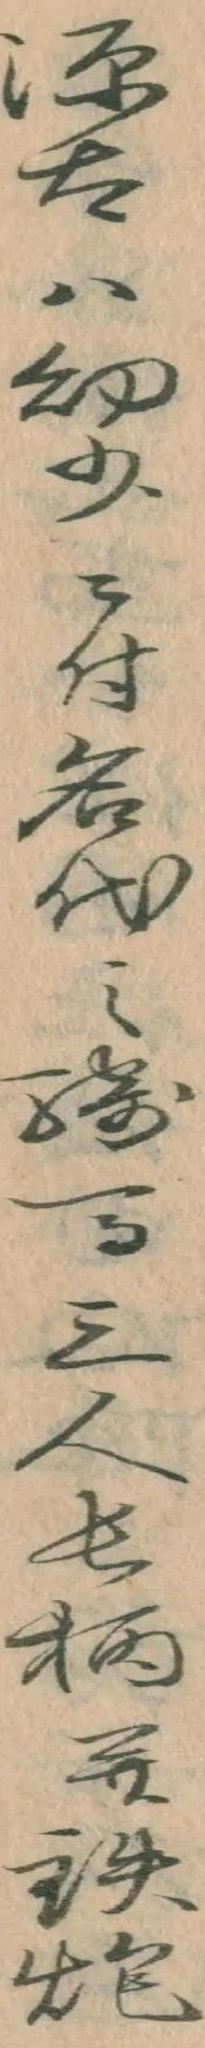源太は幼少に付名代之騎馬三人長柄幷鉄炮
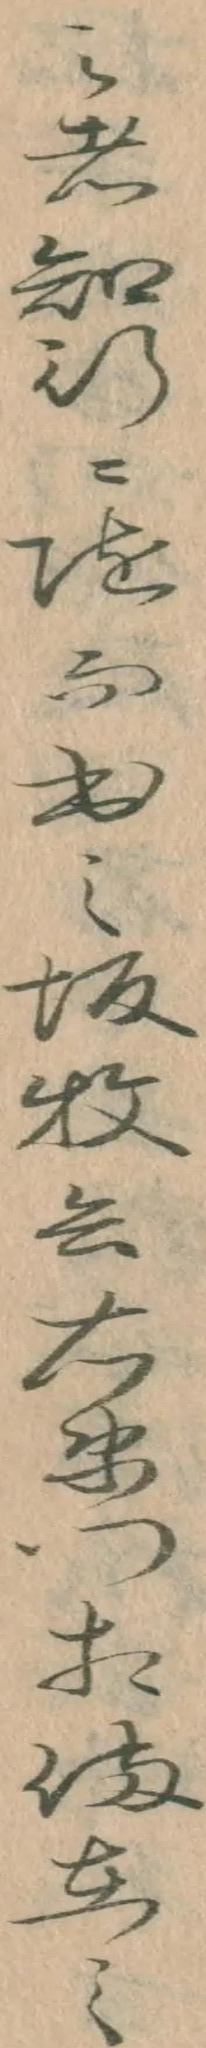之者知行に随而出之坂牧兵右衛門相備在之
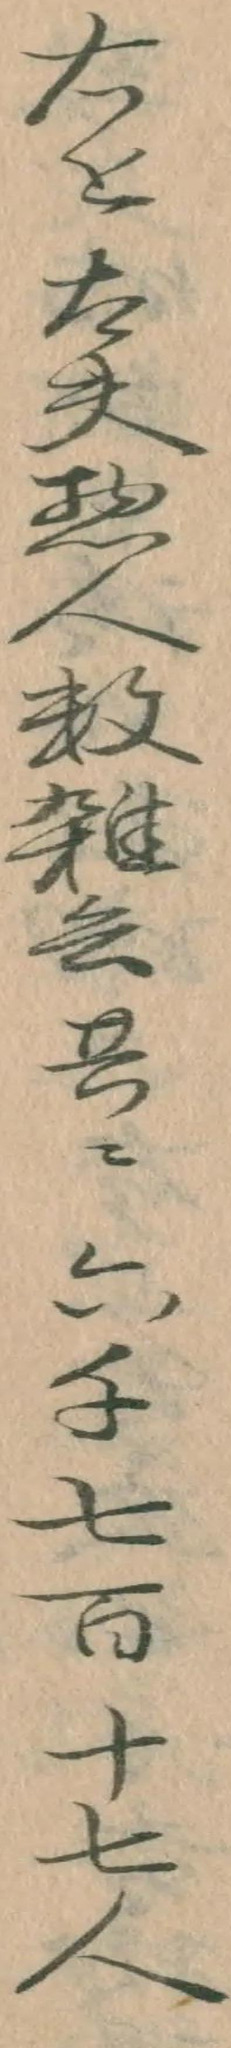右近太夫惣人数雑兵共に六千七百十七人
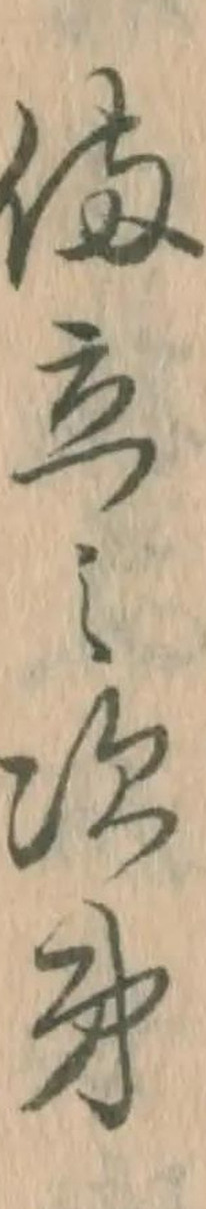備立之次第
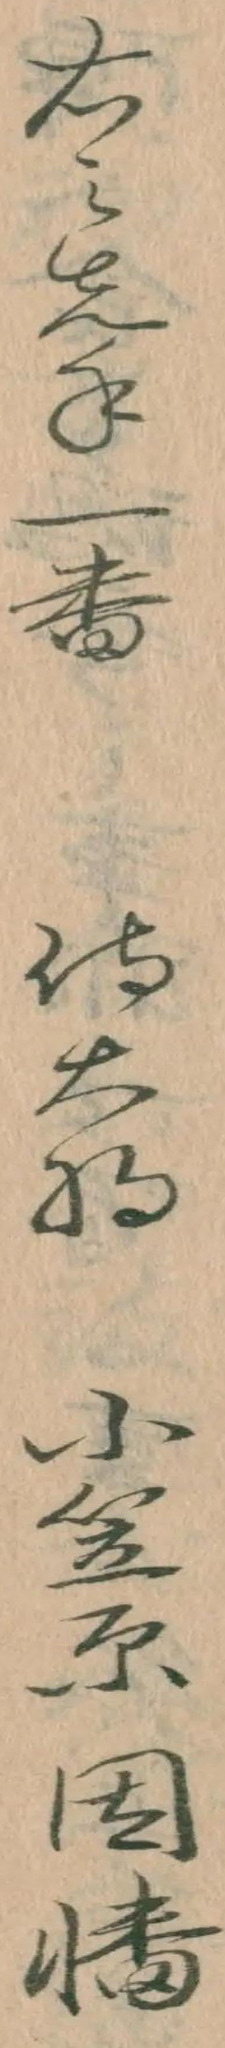右之先手一番侍大将小笠原因幡
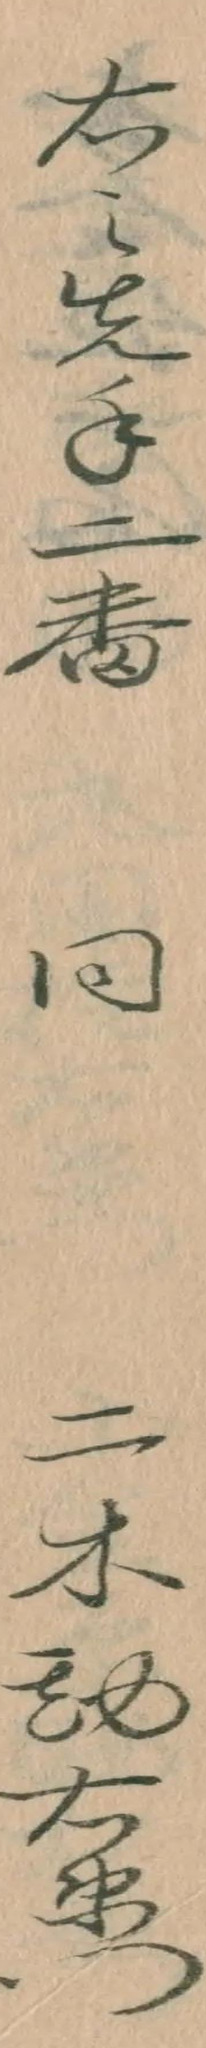右之先手二番同二木勘右衛門
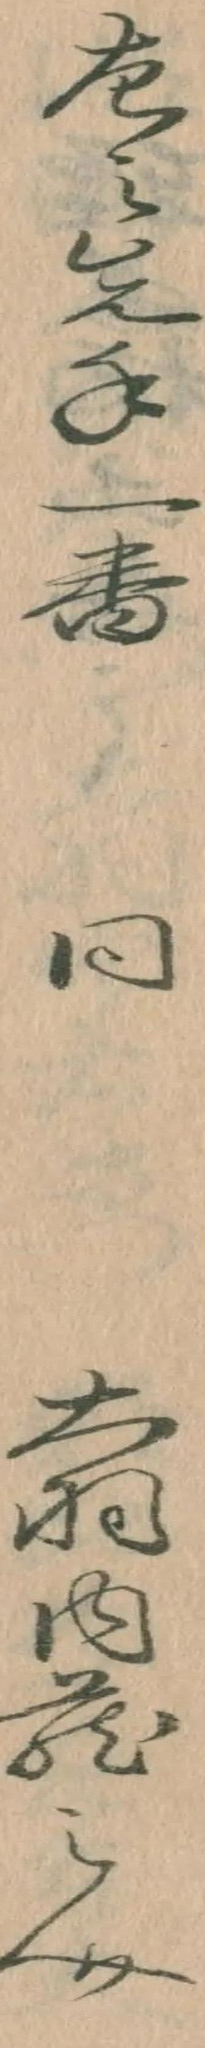左之先手一番同大羽内蔵之介
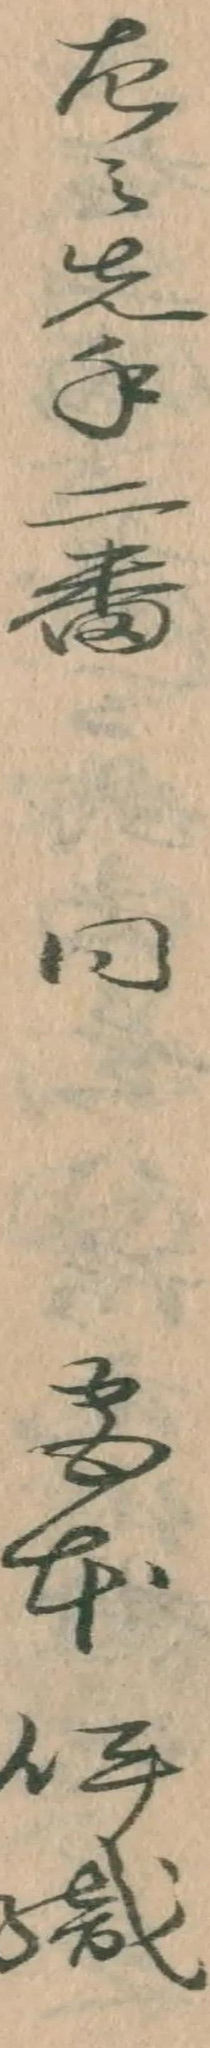左之先手二番同宮本伊織
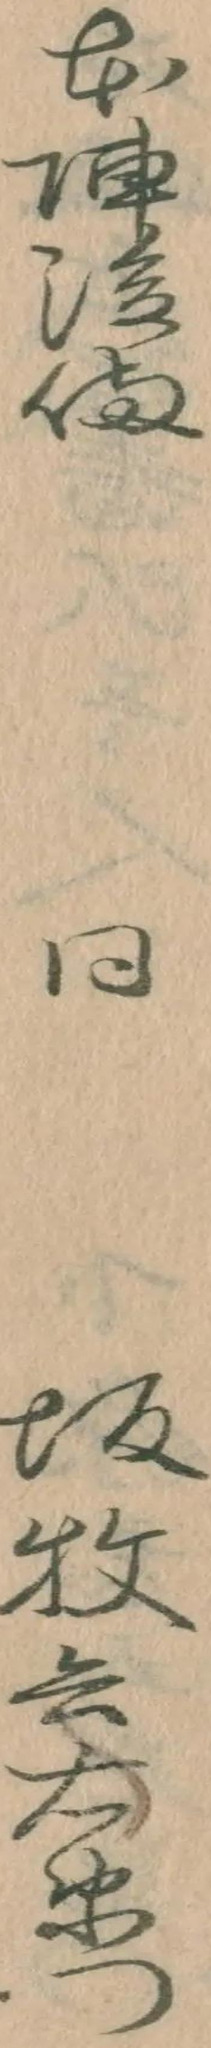本陣後備同坂牧兵右衛門
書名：切支丹御退治記 49巻. [6]
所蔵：国立国会図書館 National Diet Library, JAPAN
